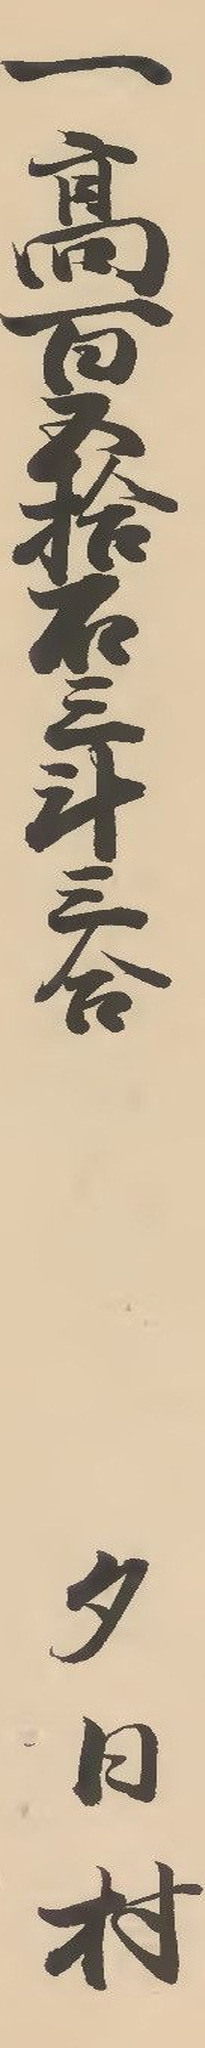一髙百五拾石三斗三合夕日村
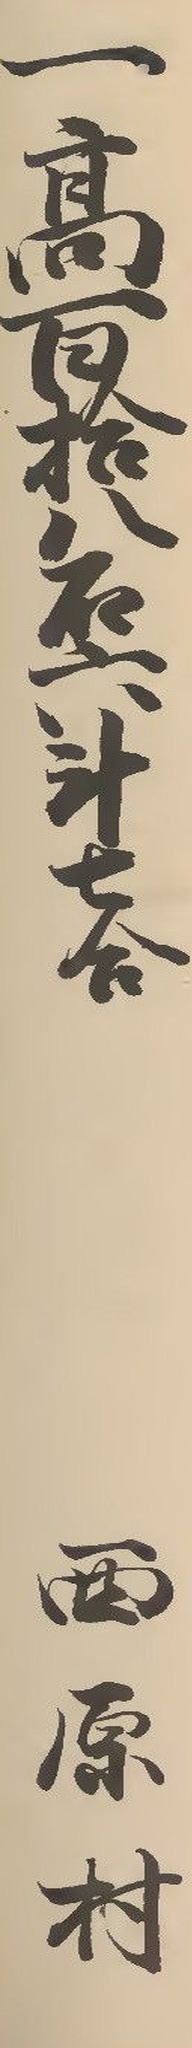一髙百拾八石六斗七合西原村
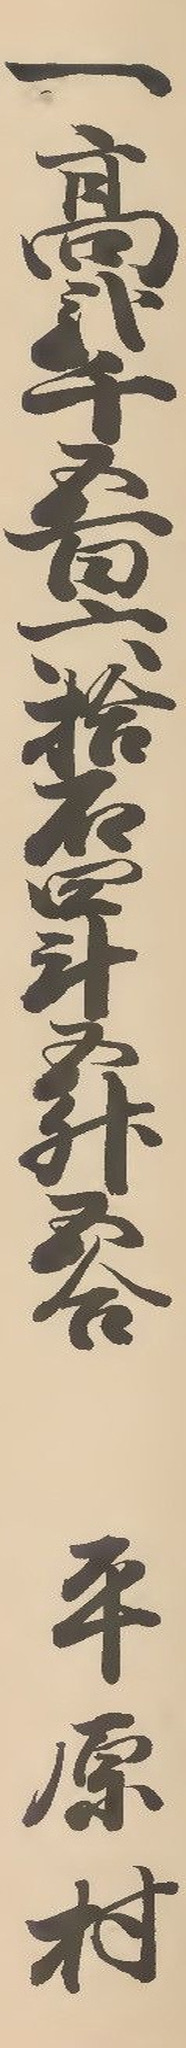一髙弐千五百六拾石四斗五升五合平原村
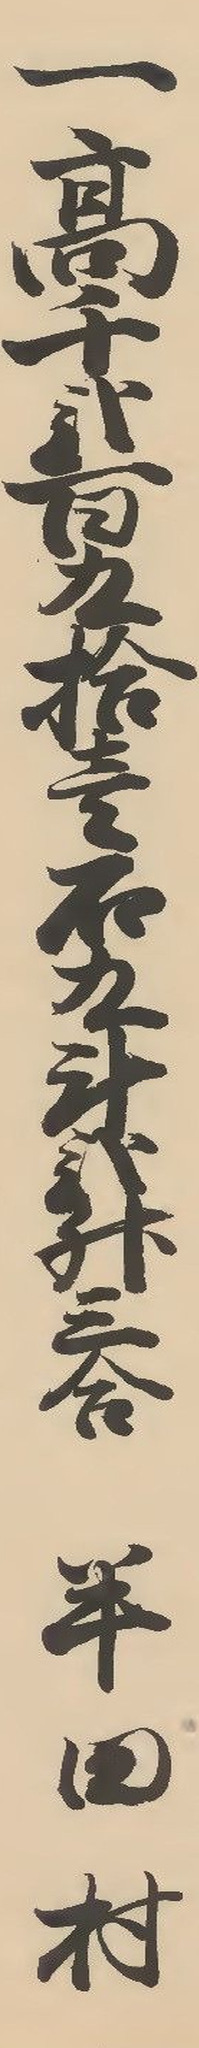一髙千弐百九拾壱石九斗弐升三合半田村
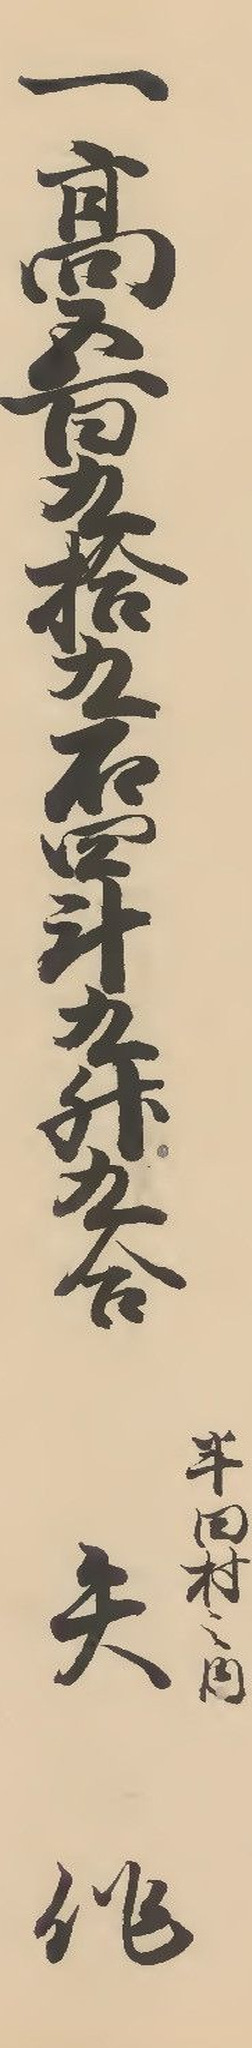一髙五百九拾九石四斗九升九合矢作
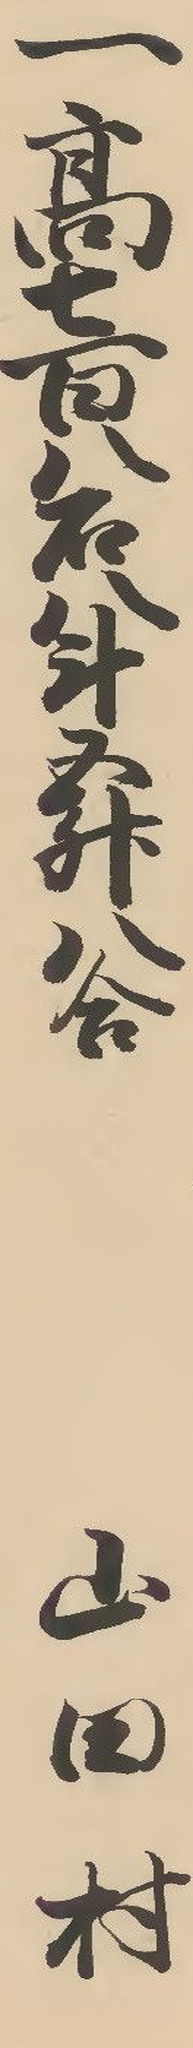一髙七百八石八斗五升八合山田村

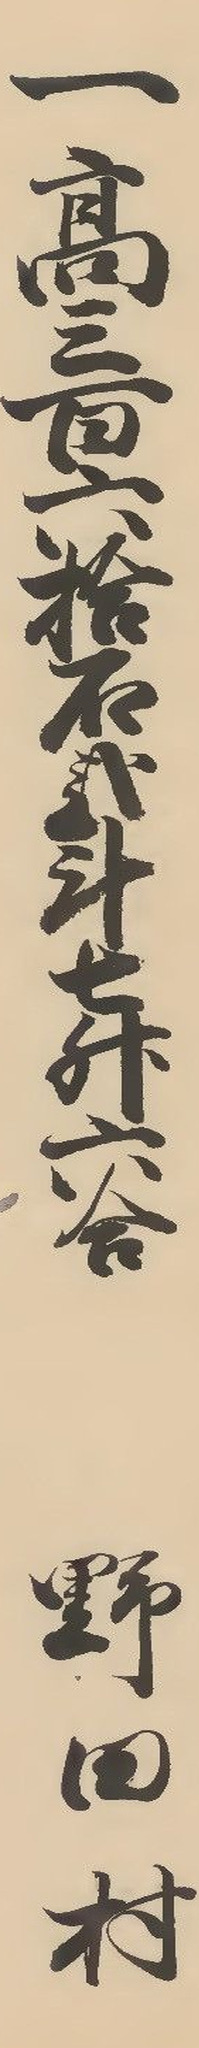一髙三百六拾石弐斗七升六合野田村
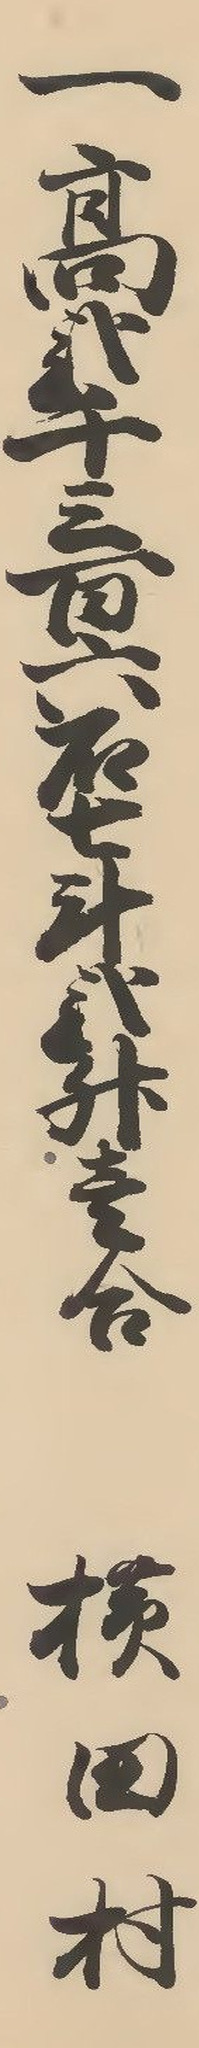一髙弐千三百六石七斗弐升壱合横田村
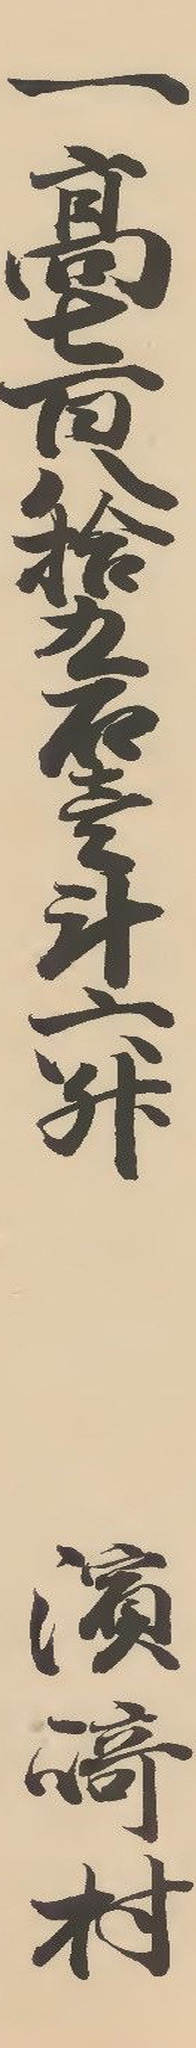一髙七百八拾九石壱斗六升濱崎村
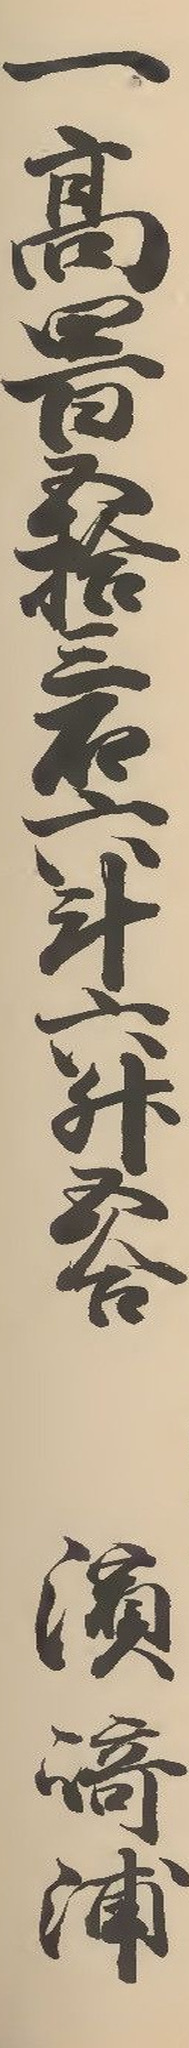一髙四百五拾三石六斗六升五合濱崎浦
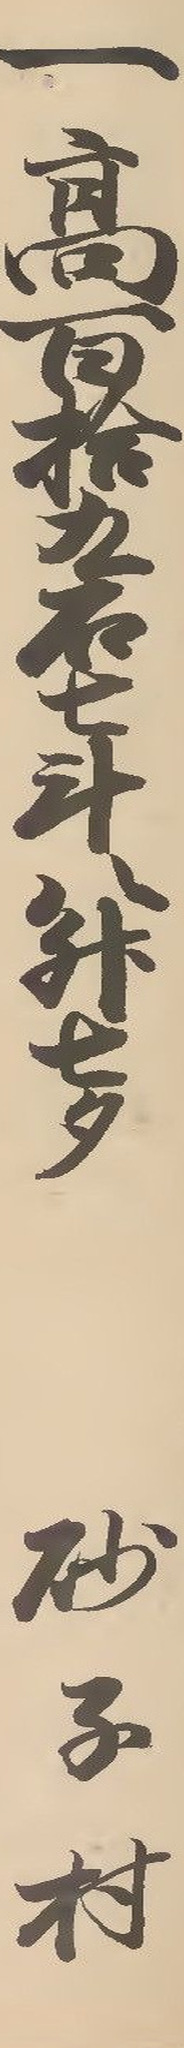一髙百拾九石七斗八升七タ砂子村
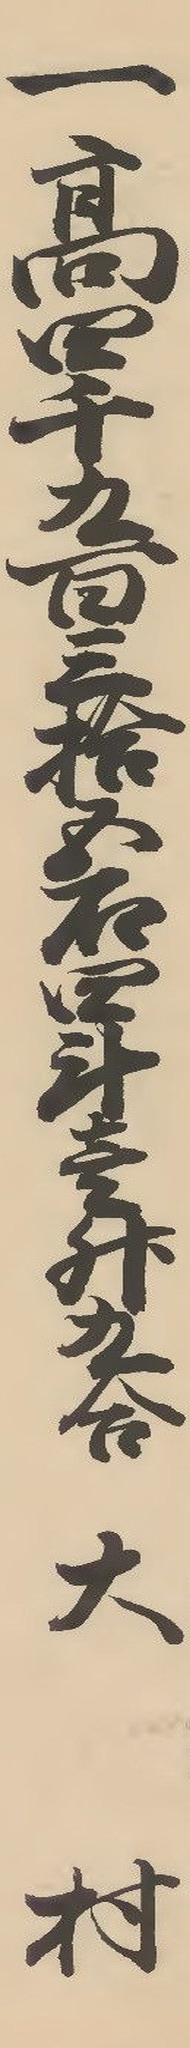一髙四千九百三拾五石四斗壱升九合大村
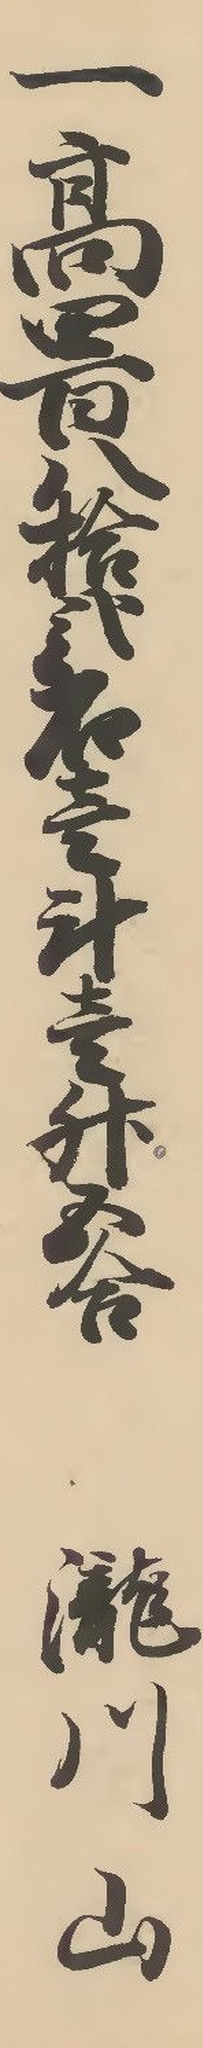一髙四百八拾弐石壱斗壱升五合瀧川山
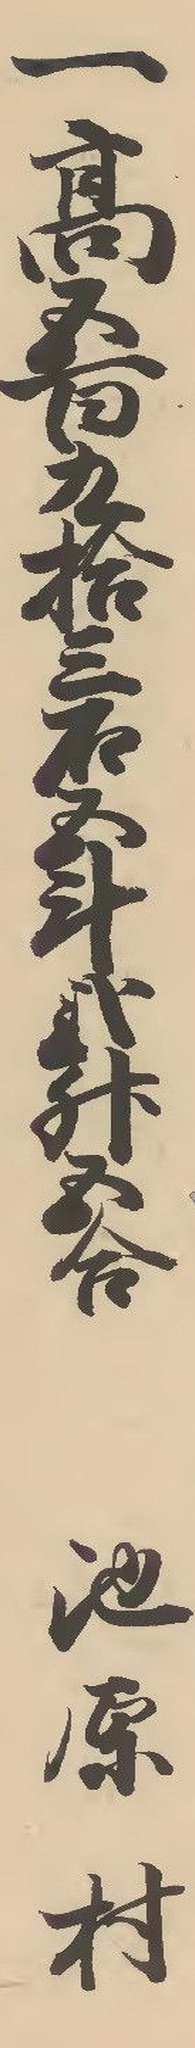一髙五百九拾三石五斗弐升五合池原村

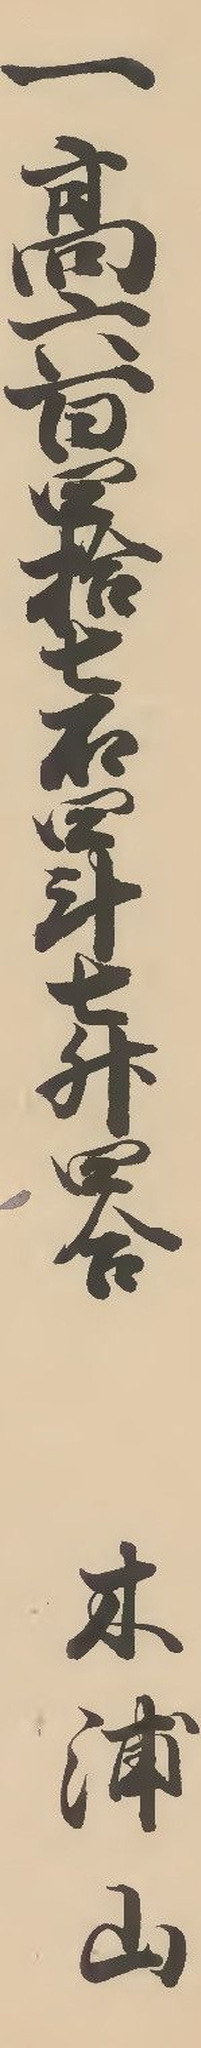一髙六百四拾七石四斗七升四合木浦山
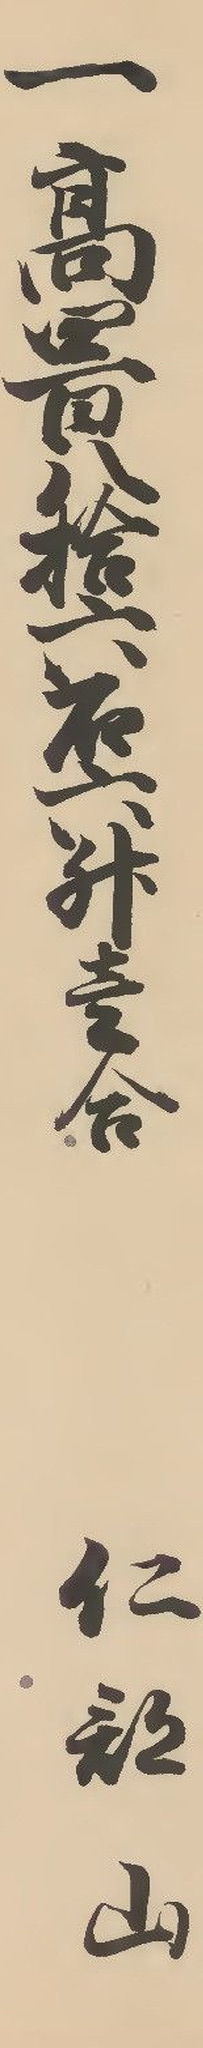一髙四百八拾六石六升壱合仁部山
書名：肥前国郷帳
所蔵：国立公文書館 National Archives of Japan
